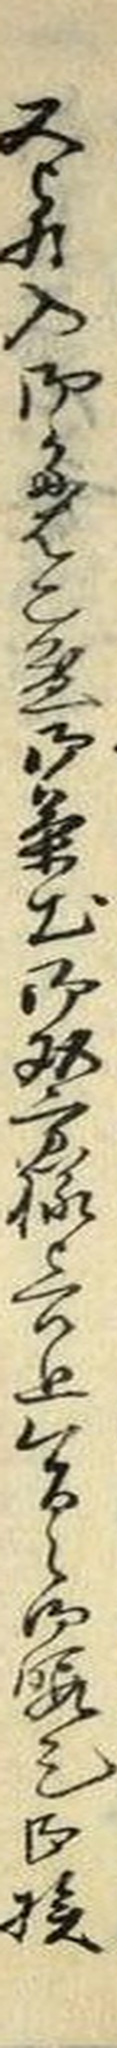又被為入御たはこ盆御茶出御双方様被召上今日之御暇乞御挨
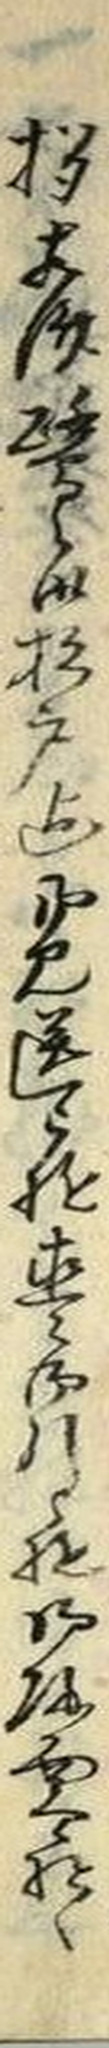拶相済鷺之御杉戸迄御見送被遊直ニ御引被遊御帰殿被遊候
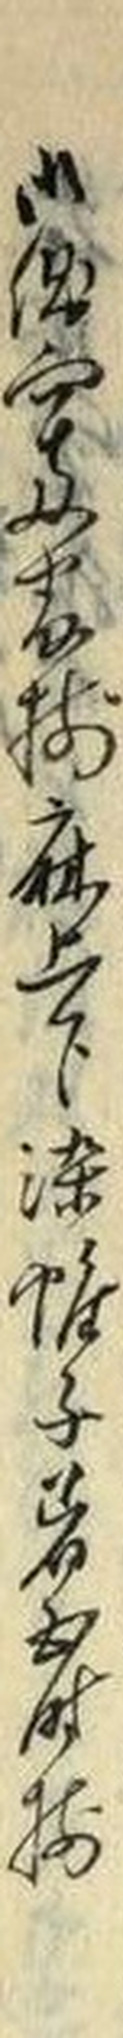御側向両番揃麻上下染帷子着五時揃
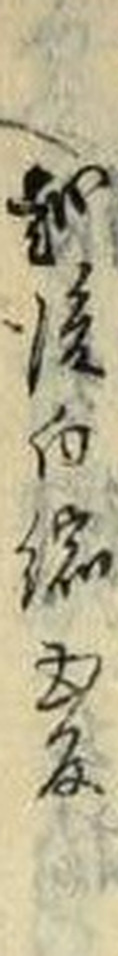越後白縮五反

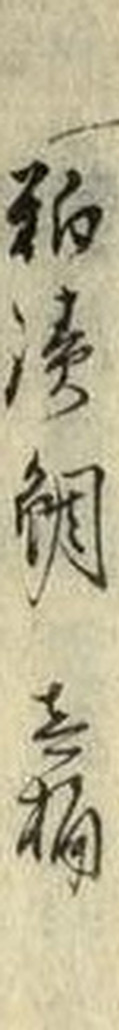粕漬鯛壱桶
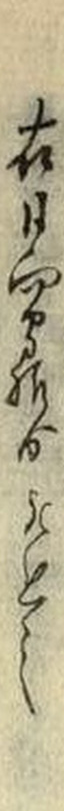右日向守様ゟ被進之
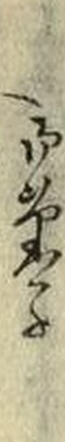御菓子
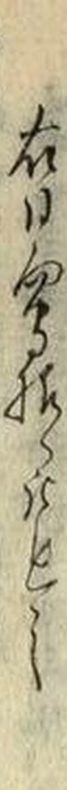右日向守様へ被進之
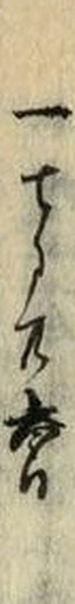一七月廿六日
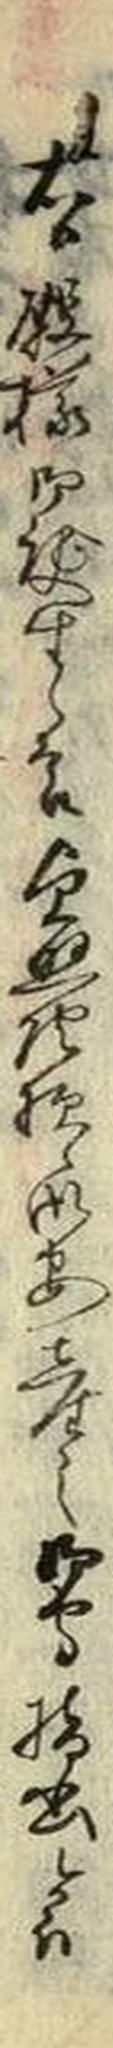右ハ殿様御誕生之節貞照院様へ御安産之御守指出候ニ付
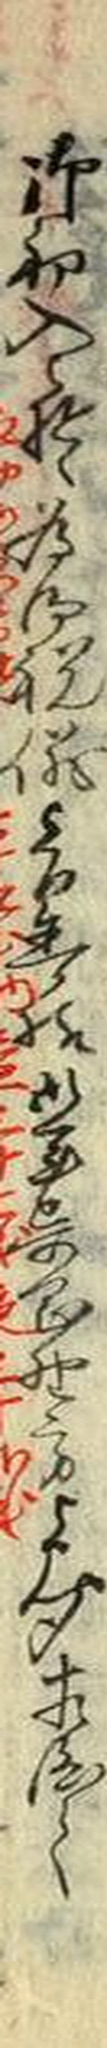御初入被遊候為御祝儀被下置候様御年寄岡野方被申聞相渡之
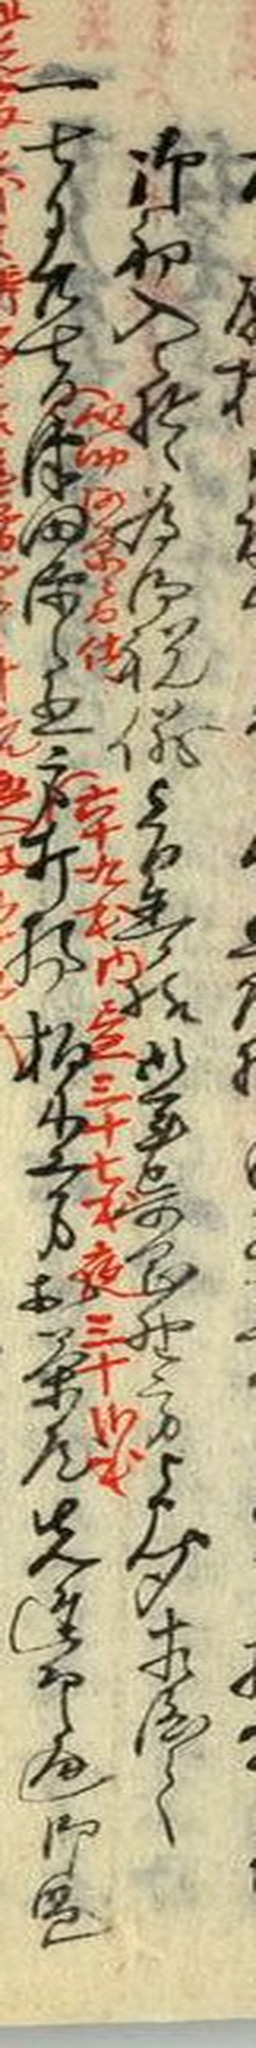一七月廿七日津田源之丞方打揚狛木工方於茶屋先達而之通御覧
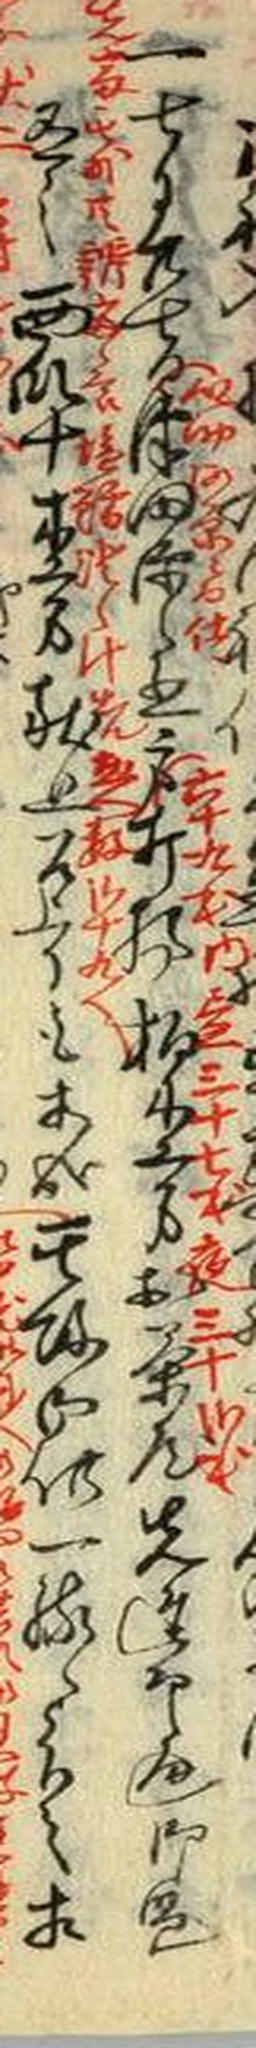有之西瓜十木工方献上召上りニも相成其余御供一統へ被下之相
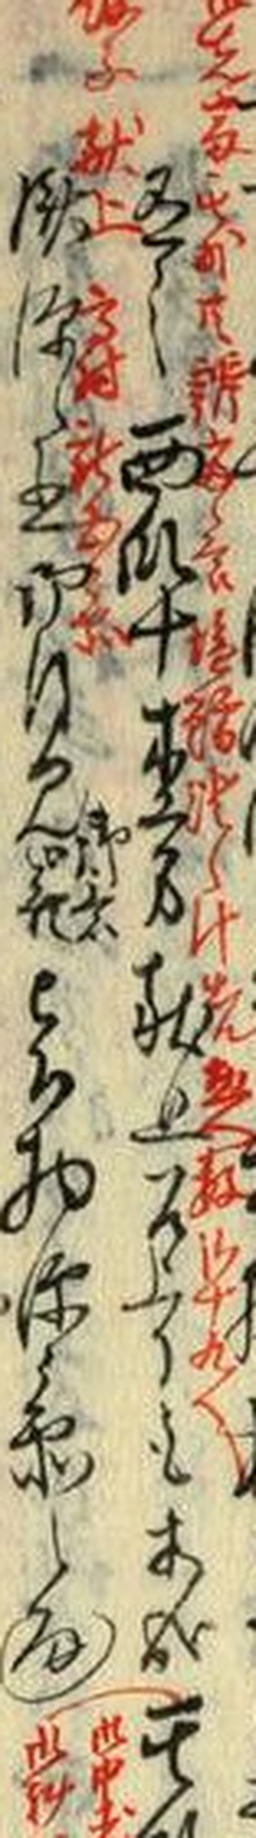済源之丞御目見御意并被下物源兵衛之通
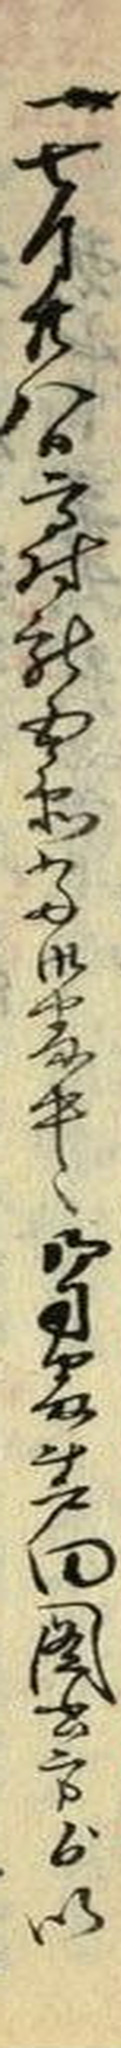一七月廿八日高村新五兵衛当御番中へ御用番芦田図書方ゟ以
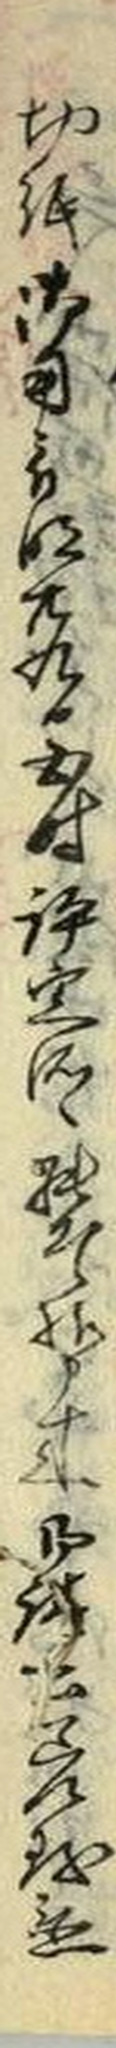切紙御用ニ付明廿九日五時評定所へ罷出候様申来御請書差越置
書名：少傅日録抄（斉承付側向頭取日記、在国）
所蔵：福井県文書館 Fukui Prefectural Archives
